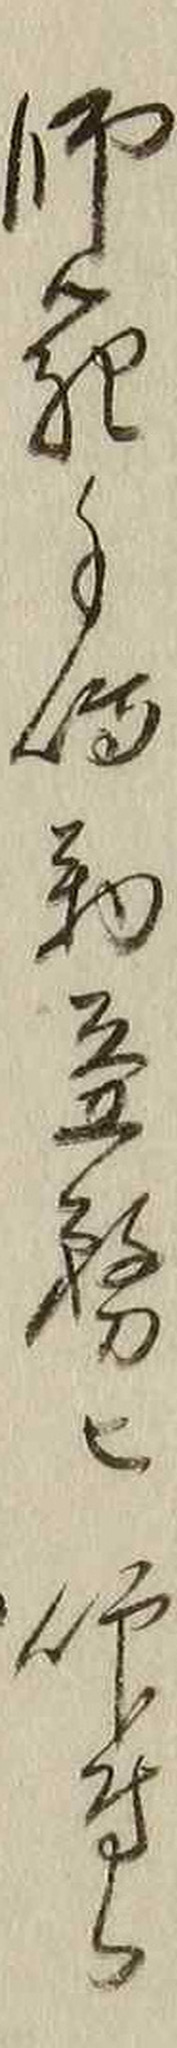師範手伝勤兼務被仰付候
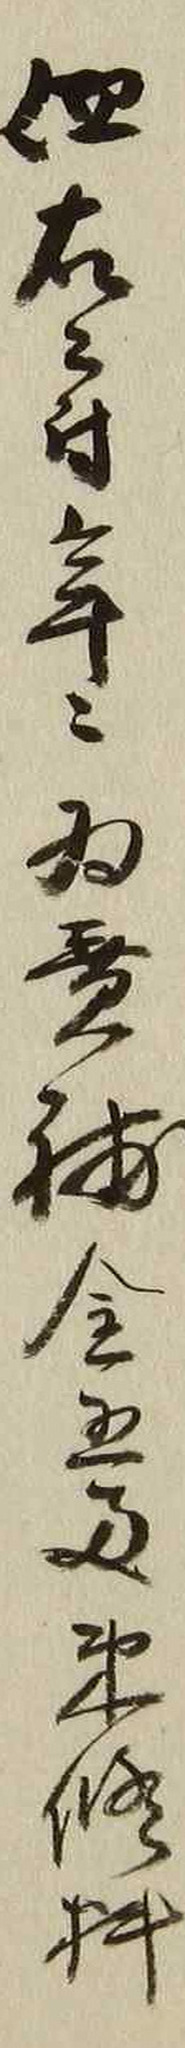但右ニ付年々為費補金五両束修料
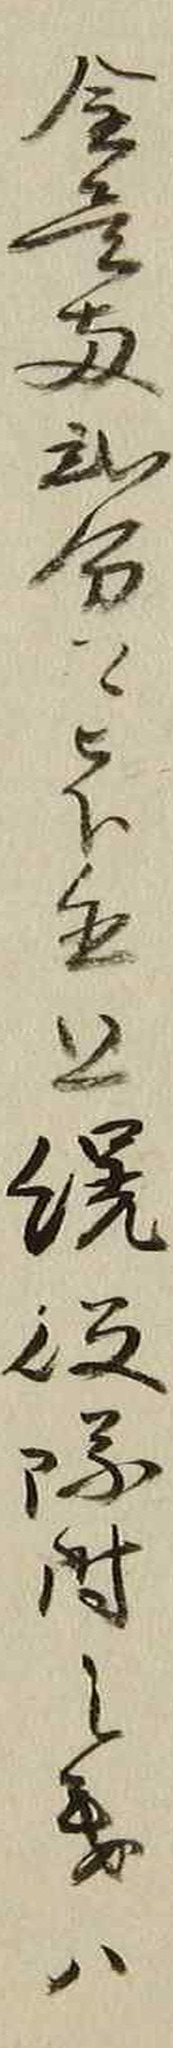金壱両弐分ツヽ被下置且縨役隊附之義ハ
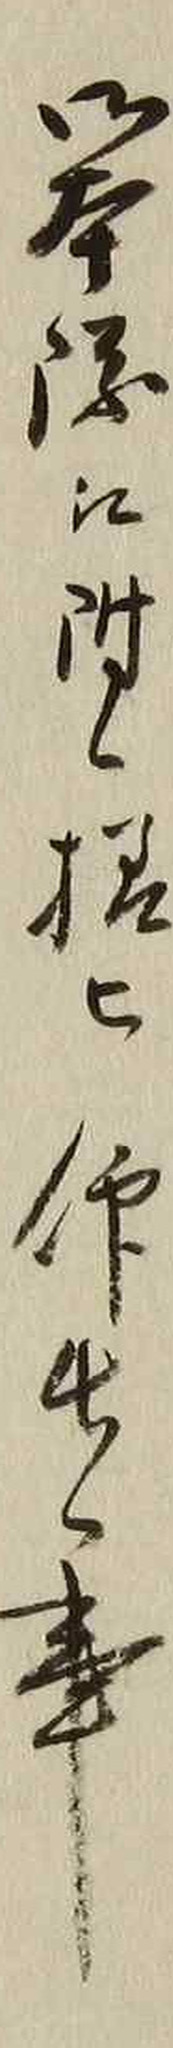御本隊江附候様被仰出候事
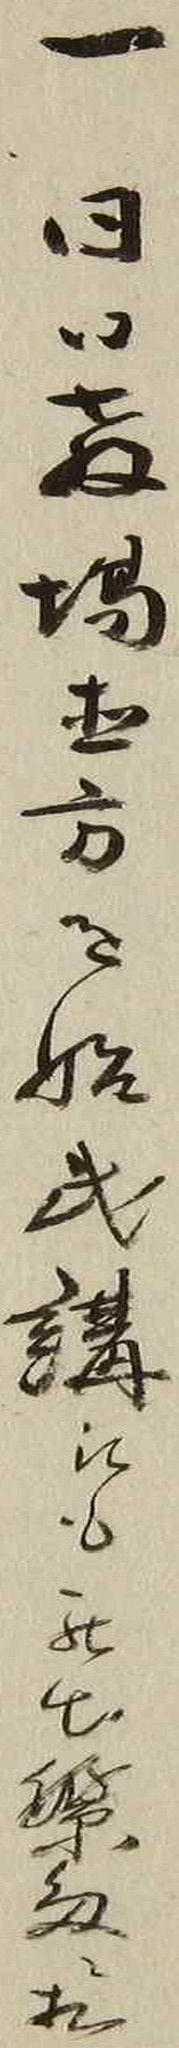一同日教場直方を始武講江も罷出繁多ニ相
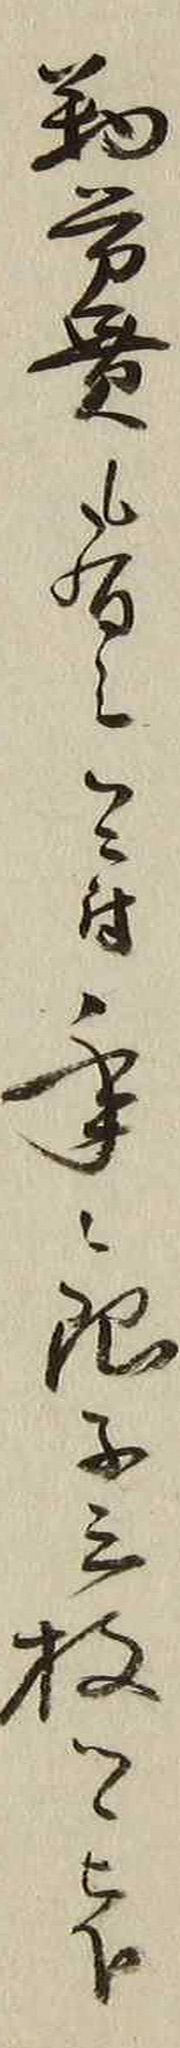勤労費も有之候ニ付年々銀子三枚ツヽ被下
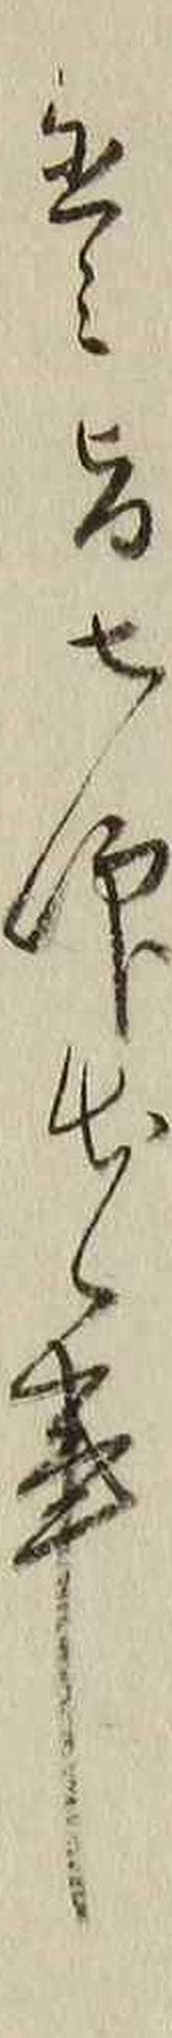置之旨被仰出候事
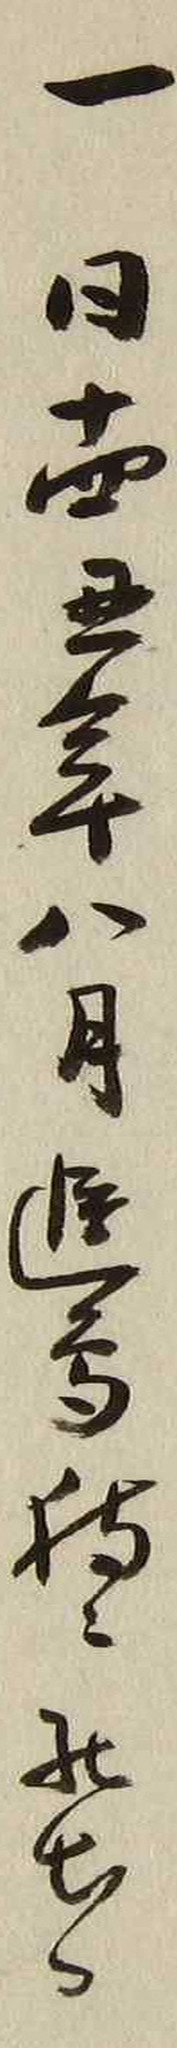一同十四丑年八月追鳥狩ニ罷出候
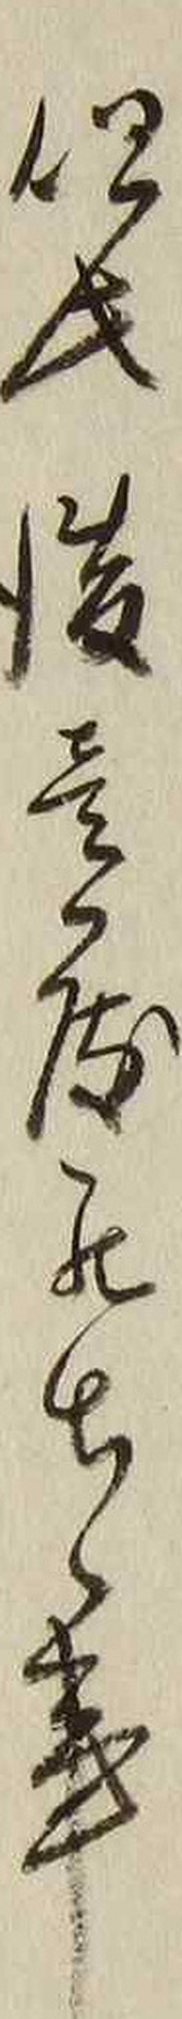但此後壱度罷出候事
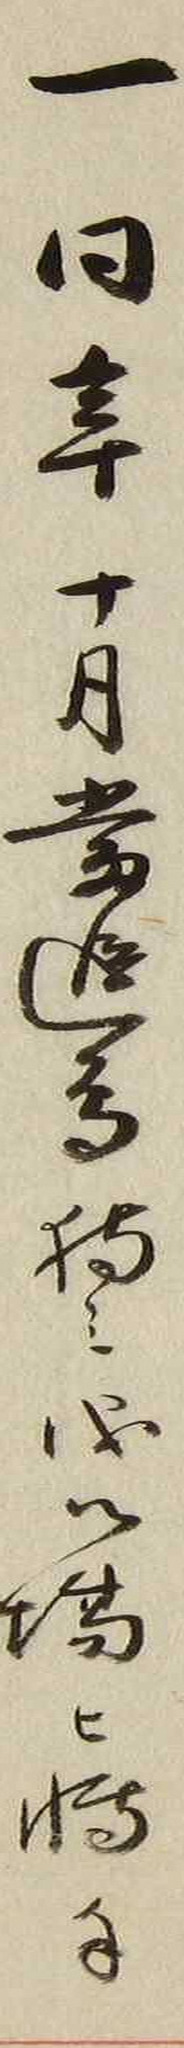一同年十月当追鳥狩之儀御場被転手
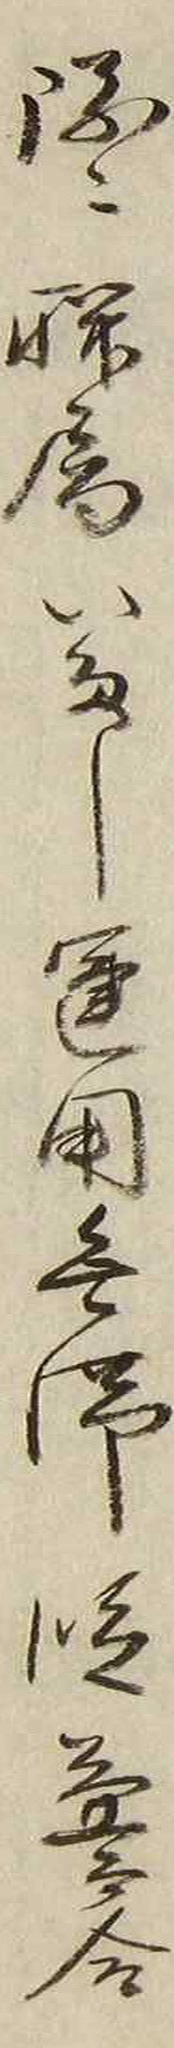隊ニ聯属いたし運用無滞段兼而合
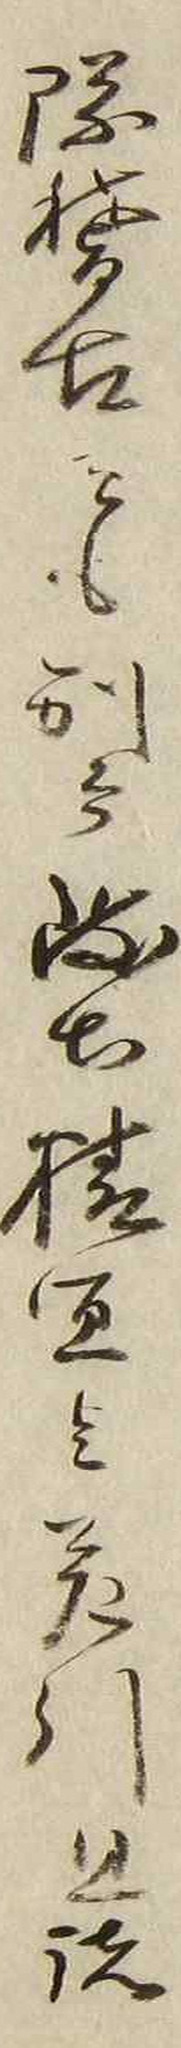隊稽古をも別而致出精宜旨差引且諸

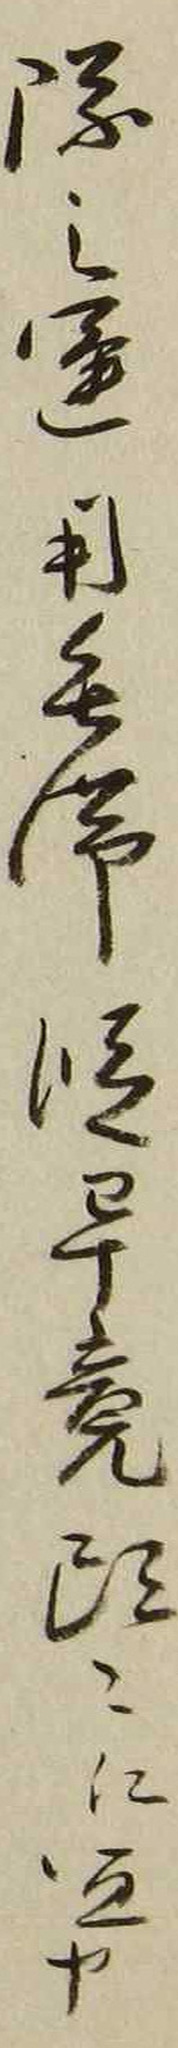隊之軍用無滞段畢竟頭々江宜申
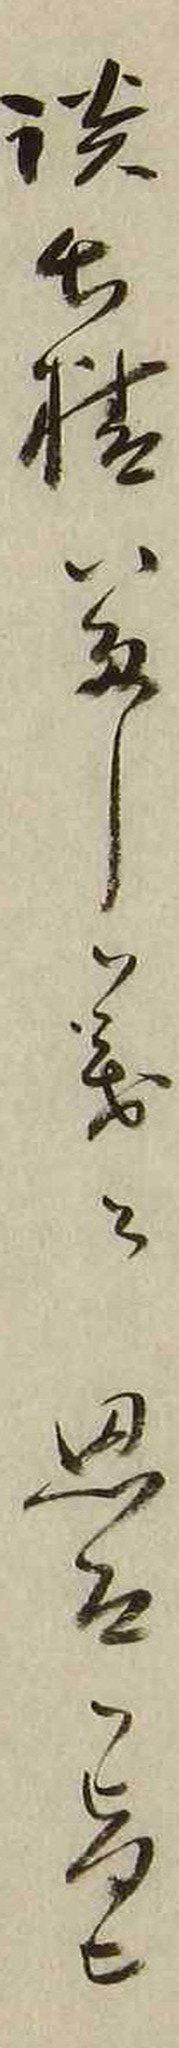談出精いたし候義と思召候旨被
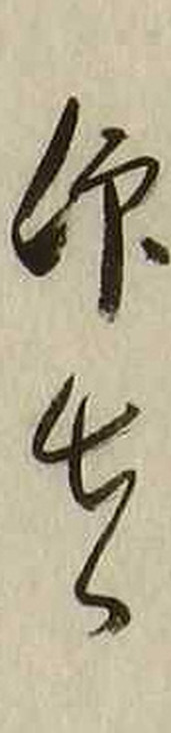仰出候
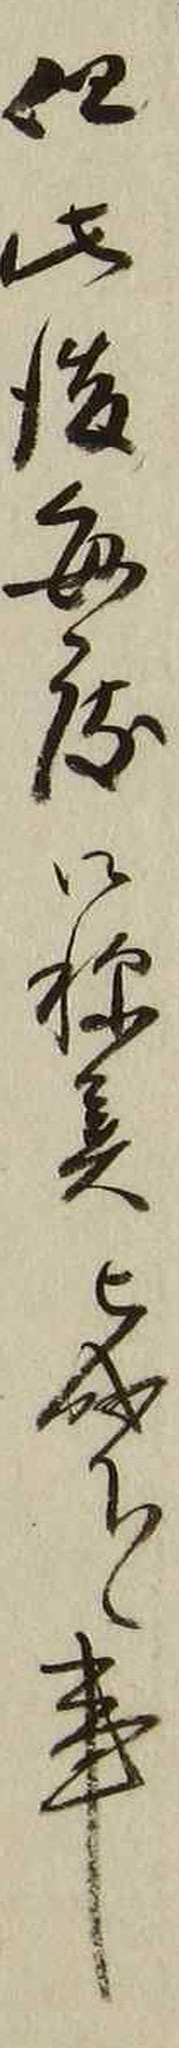但此後毎度御称美被成下候事
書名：諸士系譜　巻之311　し之部1
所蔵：会津若松市立会津図書館
